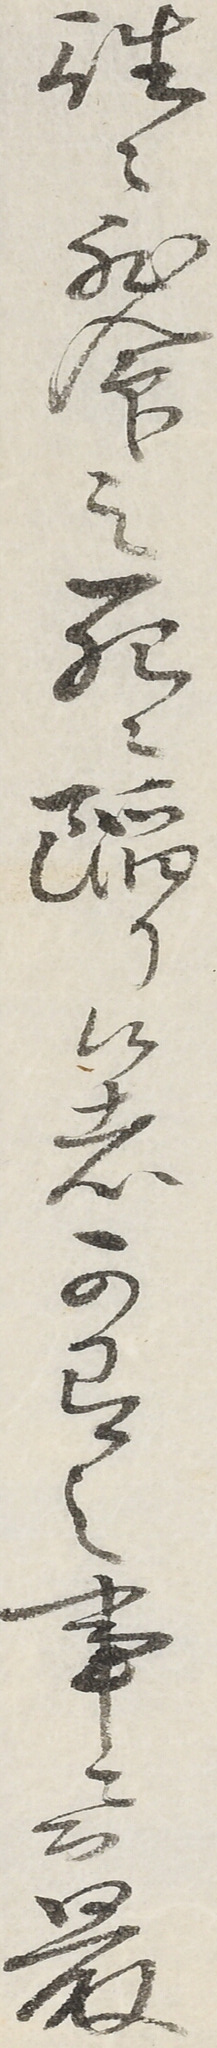往々非命之死ニ隔リ候者可有之事ニ而最
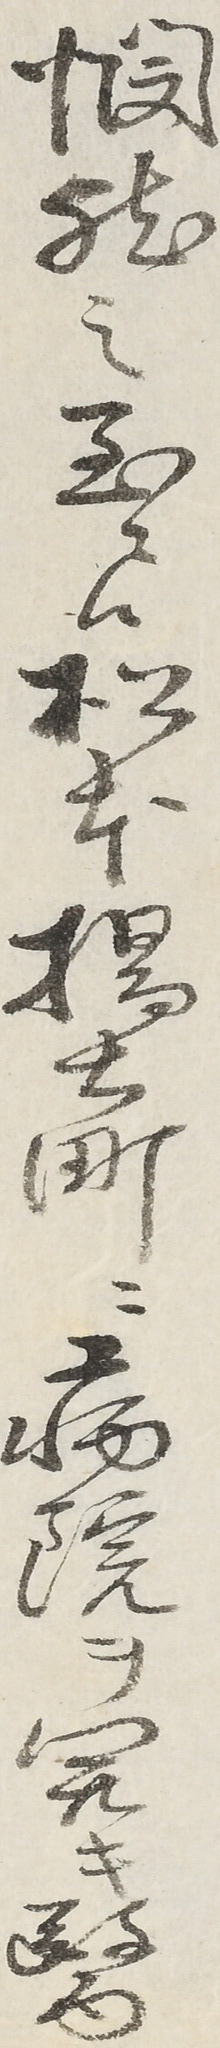憫就之至ニ候松本揚土町ニ病院ヲ開キ医
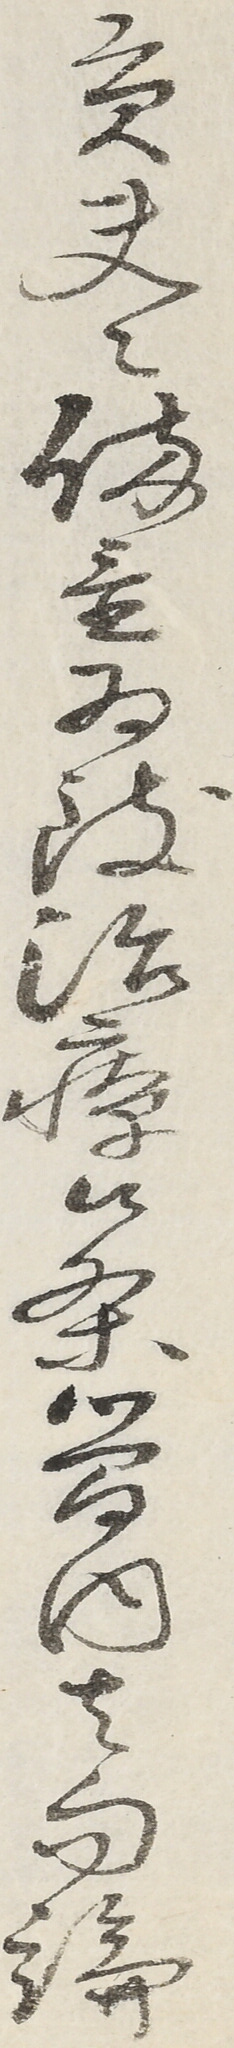員夫々備置為致治療候条簡内は勿論
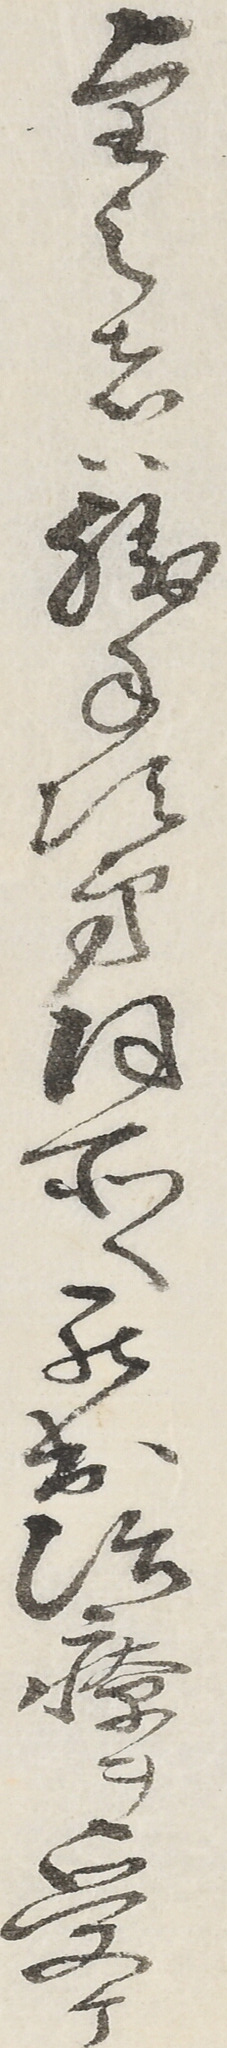望之者ハ勝手次第同所へ罷出治療ヲ受ヶ
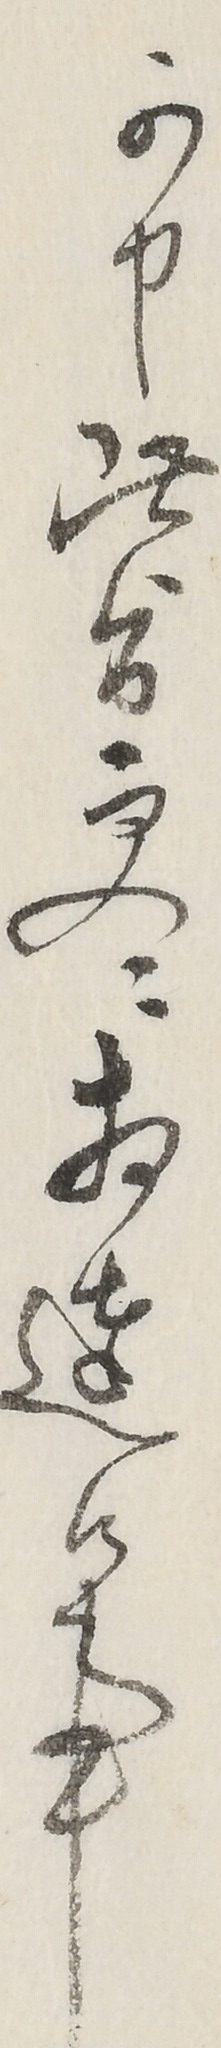可申此旨更ニ相達候事
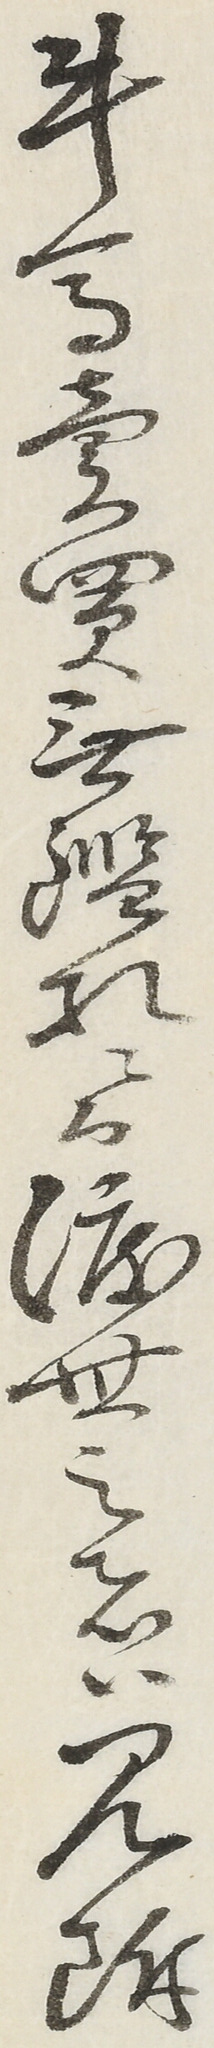牛馬売買無鑑札ニ而渡世之者見附
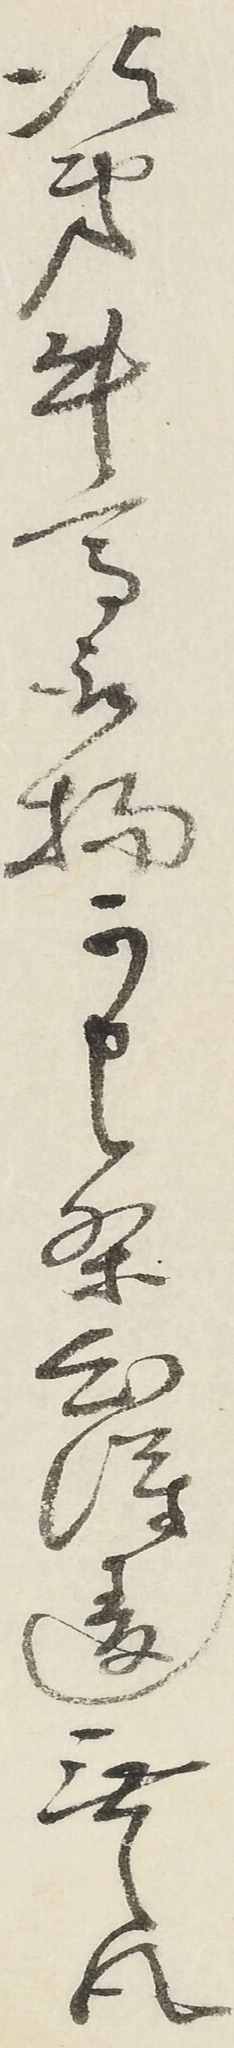次第牛馬取揚可申候条心得違無候様
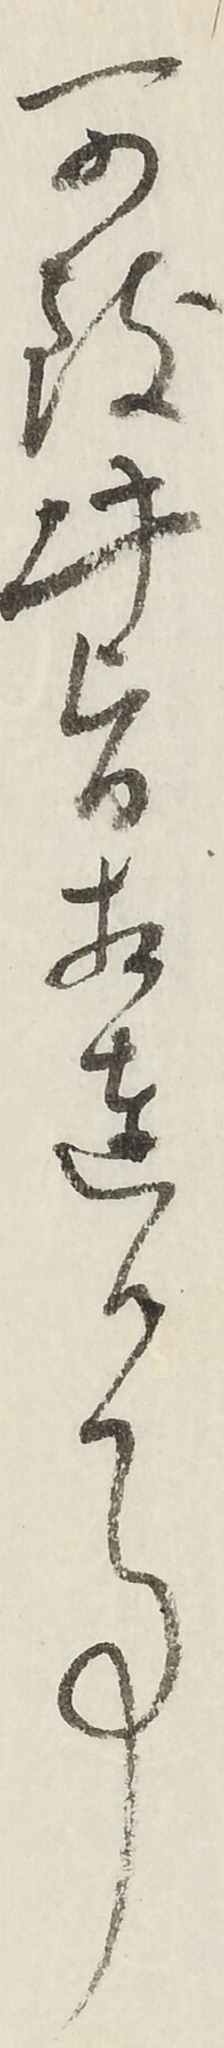可致此旨相達候事
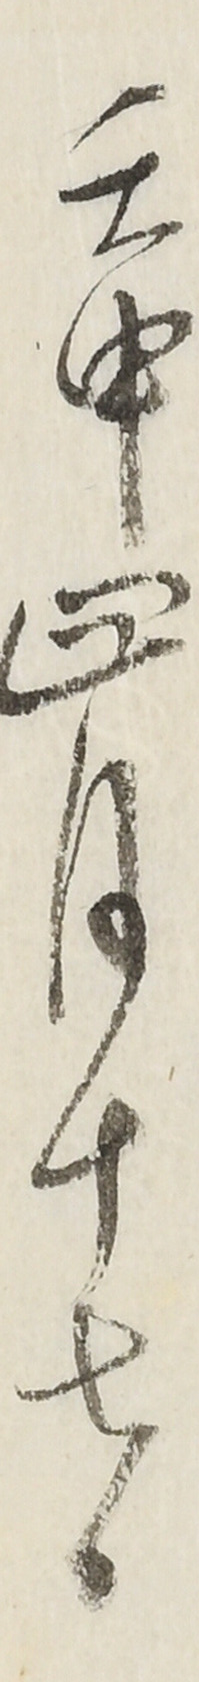壬申正月十七日
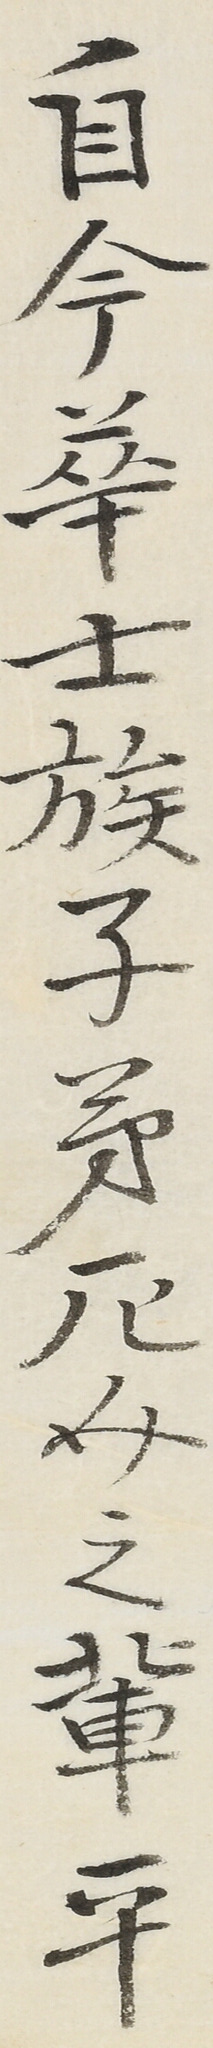自今卒士族子弟厄介之輩平
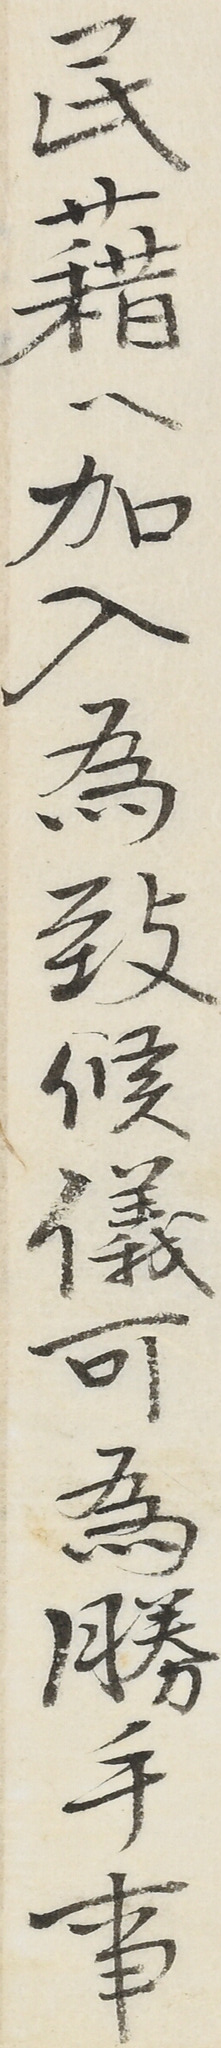民籍へ加入為致候可為勝手事

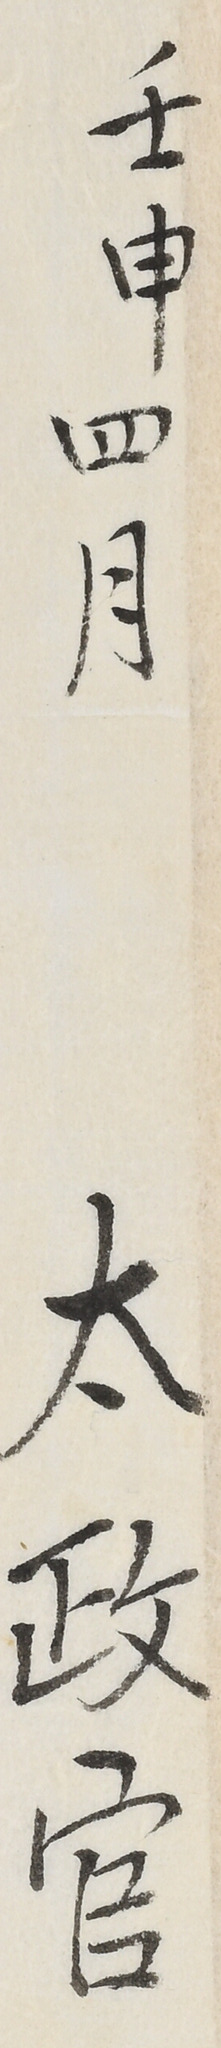壬申四月太政官
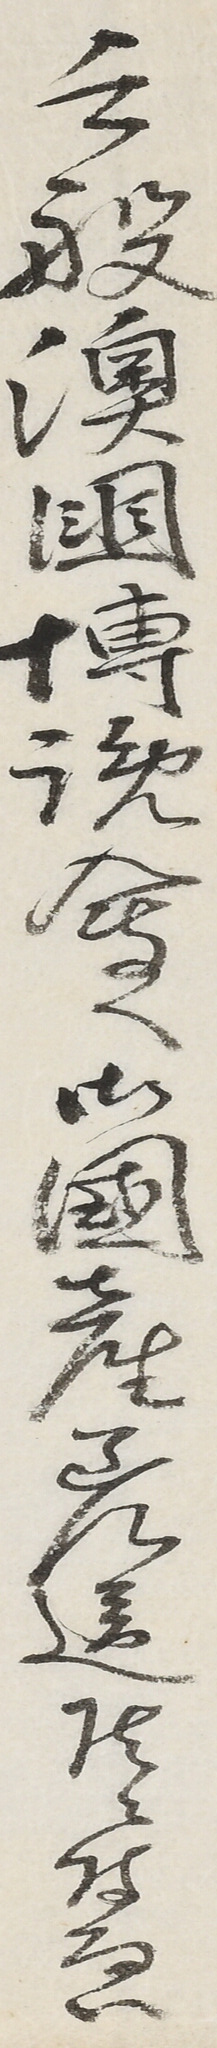今般澳国博覧会へ御国産差違候ニ付而
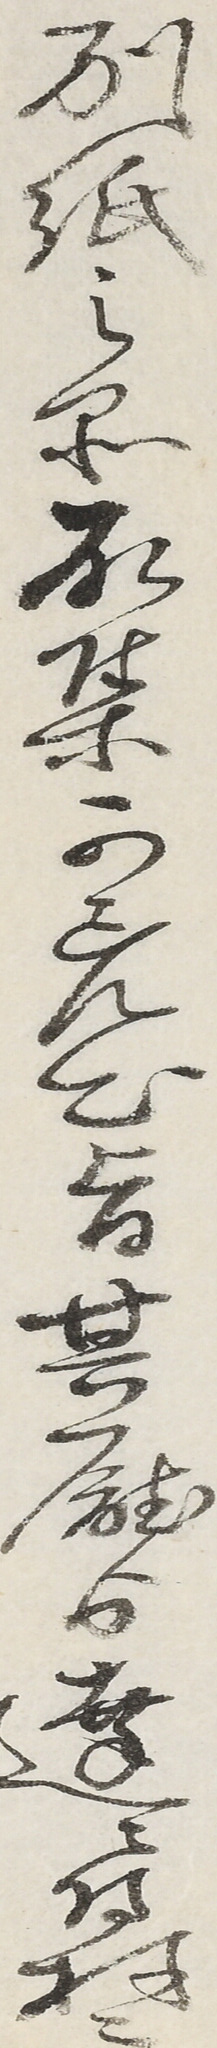別紙之品取集可差出旨其庁ゟ達ニ付村々
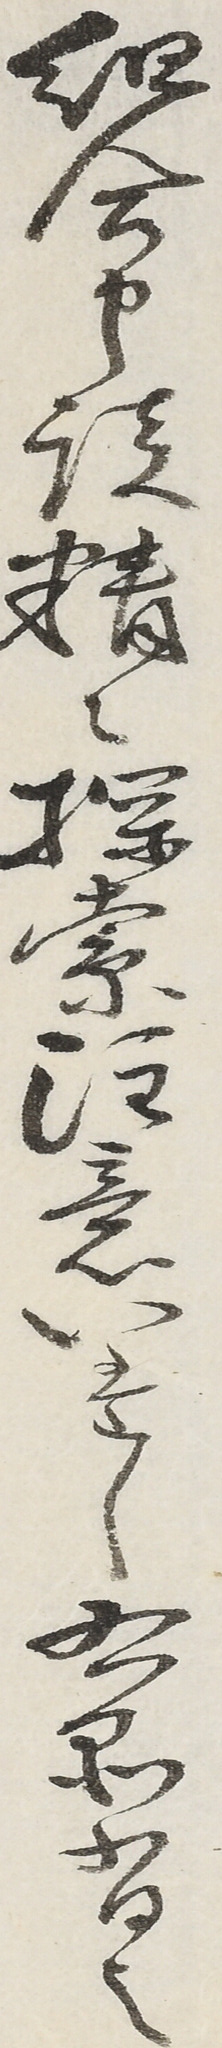組合申談精々探索注意いたし右品有之
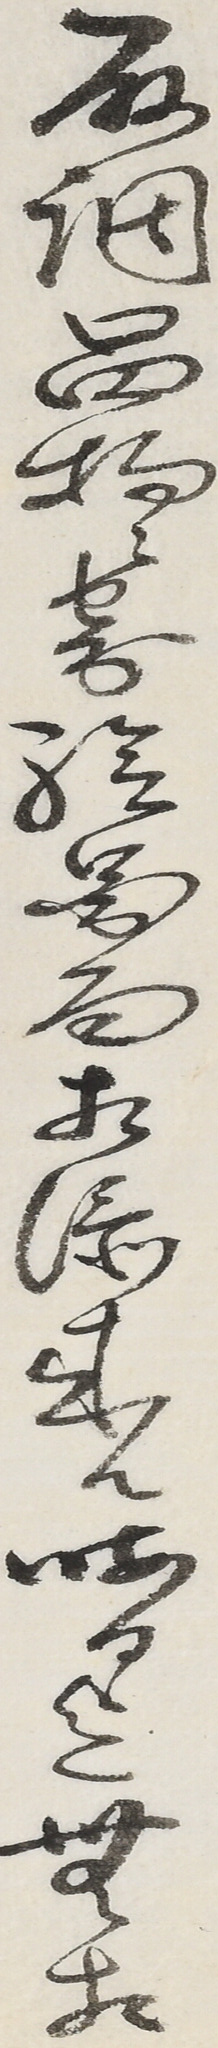取調品物ニ寄絵図面相添来ル晦日迄無相
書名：廻状（控）
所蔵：伊那市立高遠町図書館・合同会社AMANE
